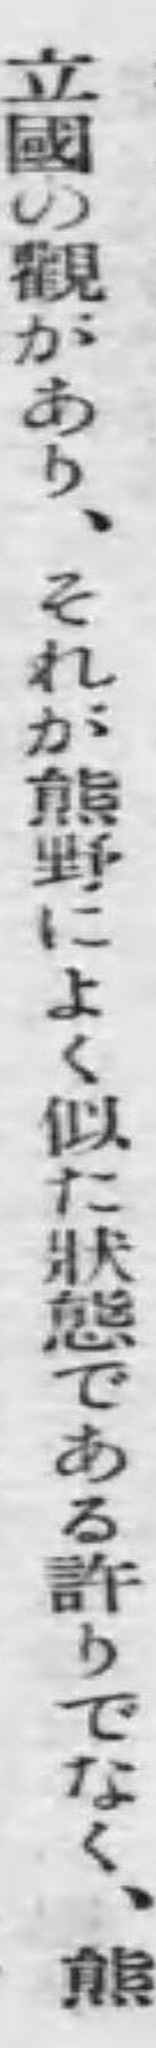立国の観があり、それが熊野によく似た状態である許りでなく、熊
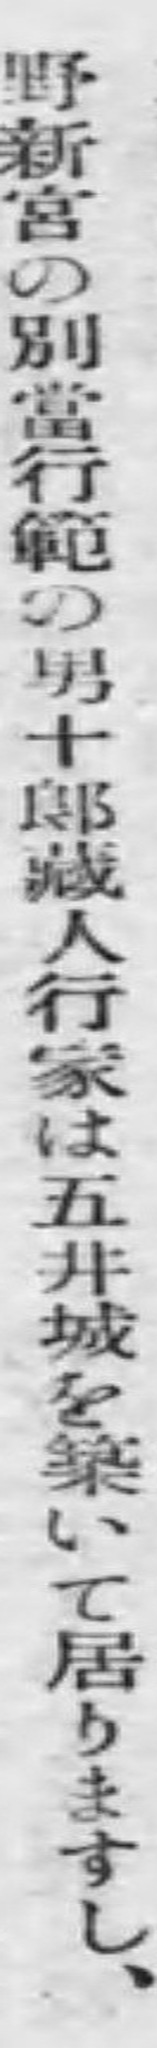野新宮の別当行範の男十郎蔵人行家は五井城を築いて居りますし、
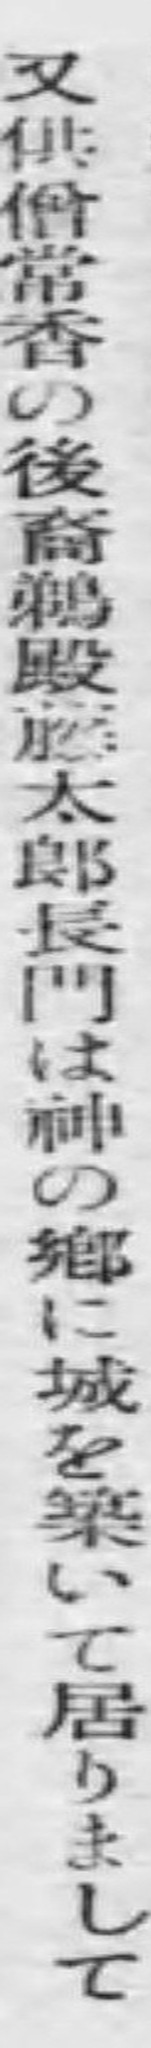又供僧常香の後裔鵜殿藤太郎長門は神の郷に城を築いて居りまして
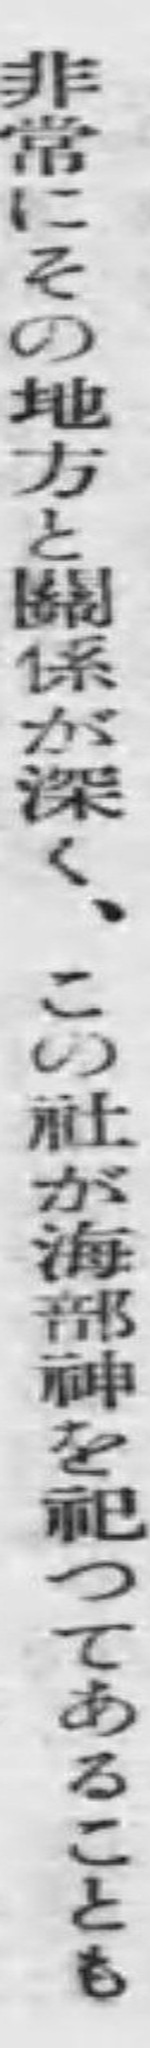非常にその地方と関係が深く、この社が海部神を祀つてあることも
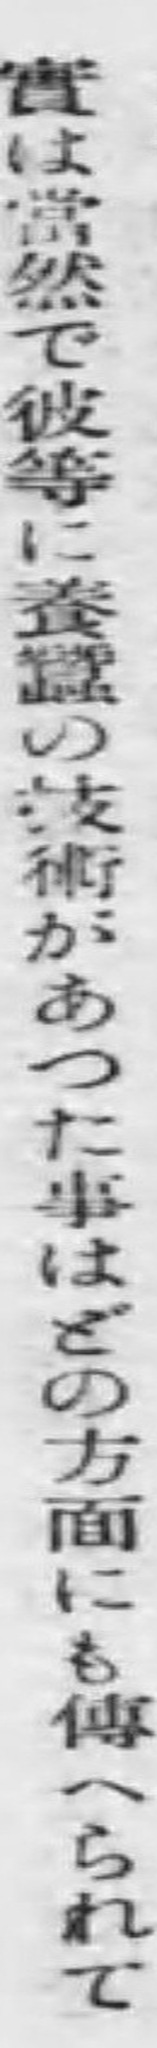実は当然で彼等に養蚕の技術があつた事はどの方面にも伝へられて
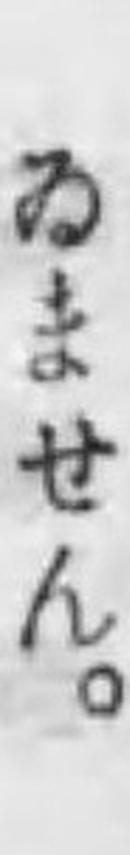ゐません。
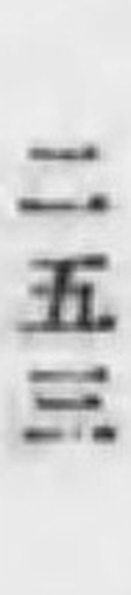二五三

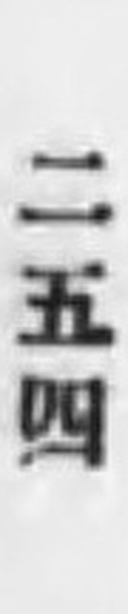二五四
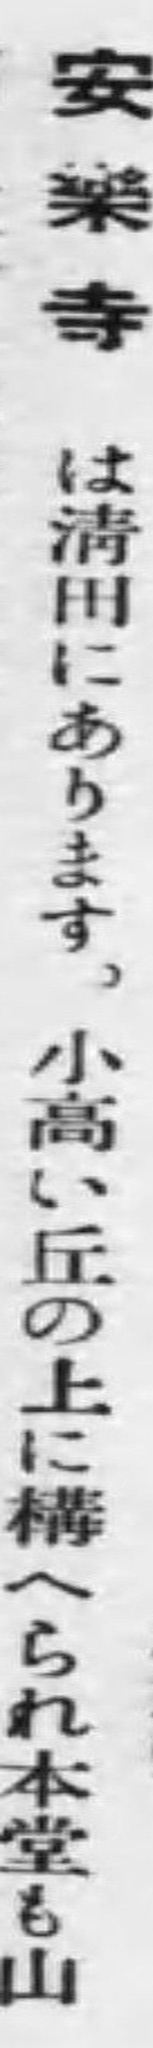安楽寺は清田にあります。小高い丘の上に構へられ本堂も山
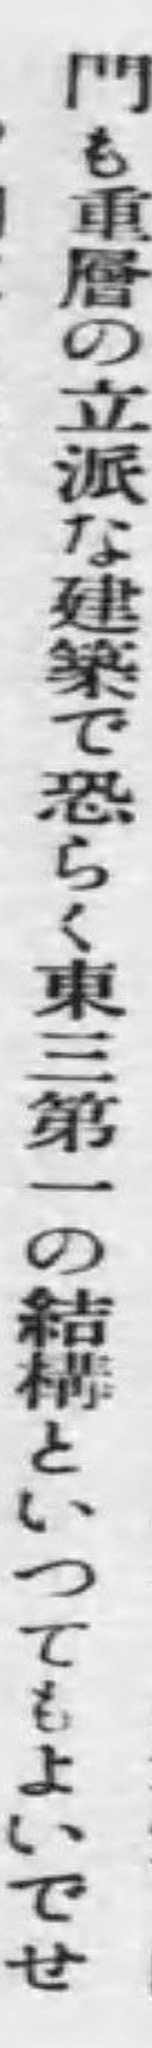門も重層の立派な建築で恐らく東三第一の結構といつてもよいでせ
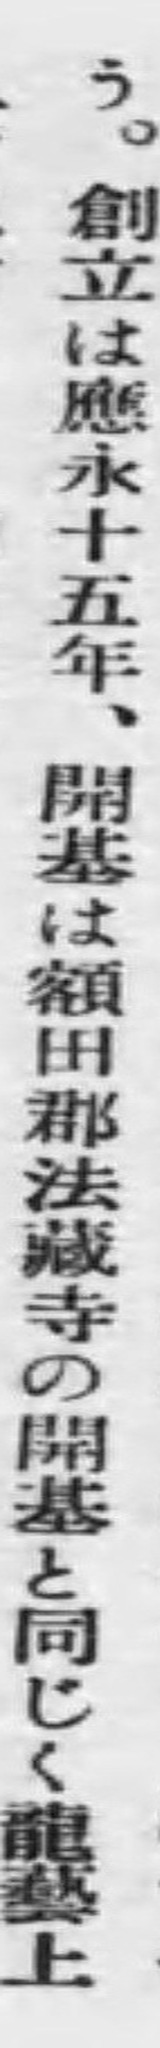う。創立は応永十五年、開基は額田郡法蔵寺の開基と同じく龍芸上
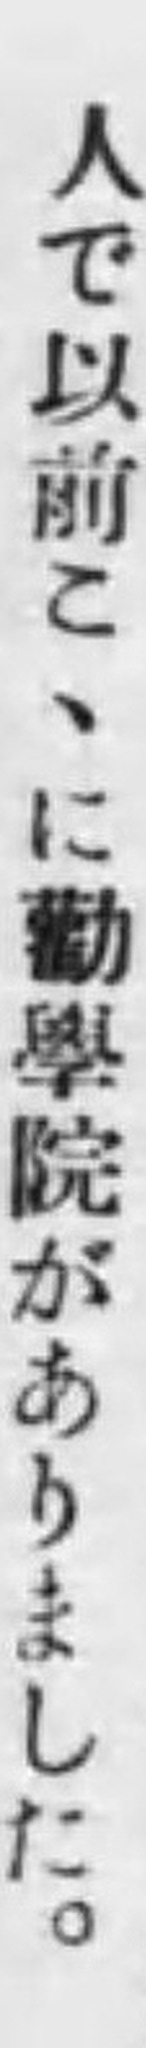人で以前こゝに勧学院がありました。
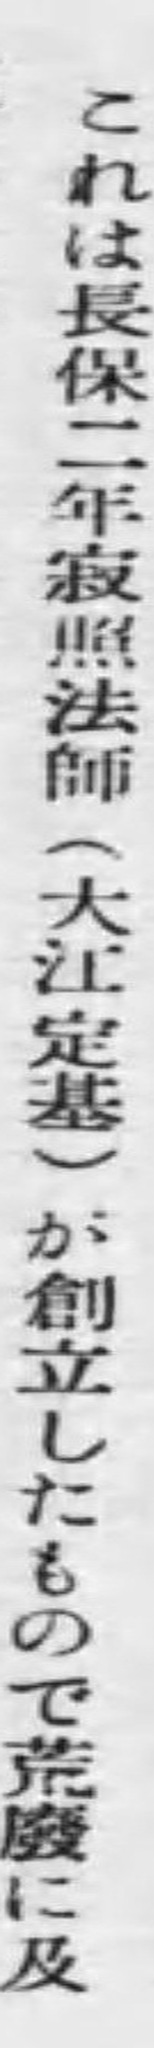これは長保二年寂照法師(大江定基)が創立したもので荒廃に及
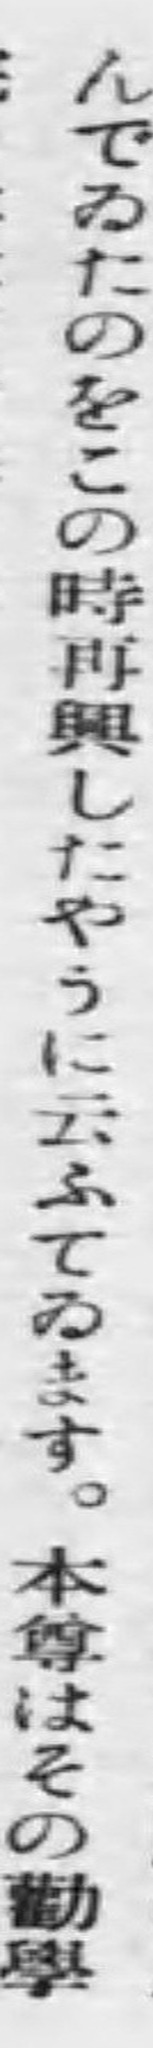んでゐたのをこの時再興したやうに云ふてゐます。本尊はその勧学
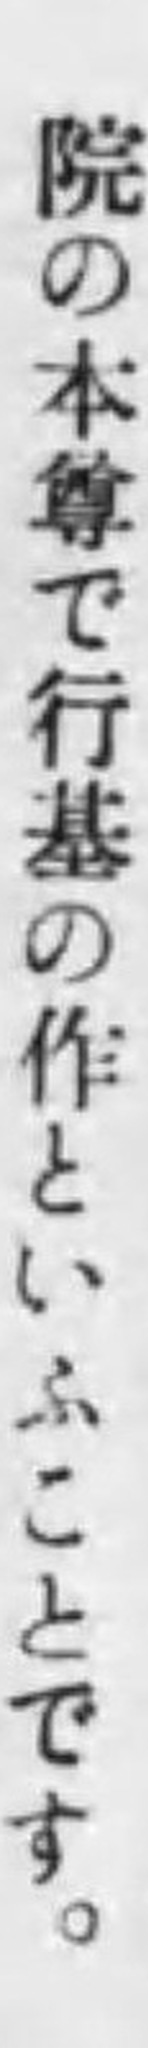院の本尊で行基の作といふことです。
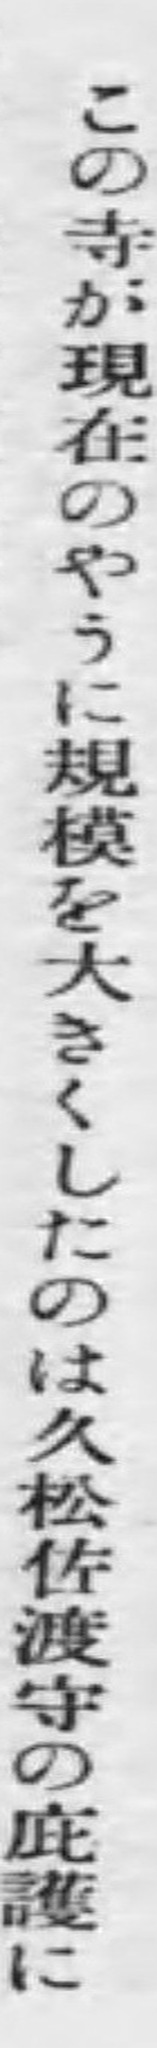この寺が現在のやうに規模を大きくしたのは久松佐渡守の庇護に
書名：東三河道中記 : 豊橋市及其附近案内
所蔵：国立国会図書館 National Diet Library, JAPAN
